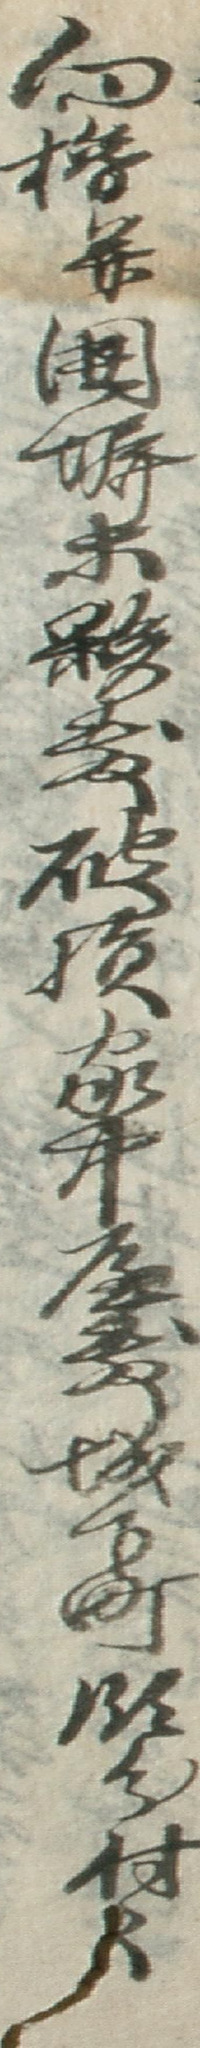向櫓并囲塀等夥敷破損家中屋敷城下町領分村々

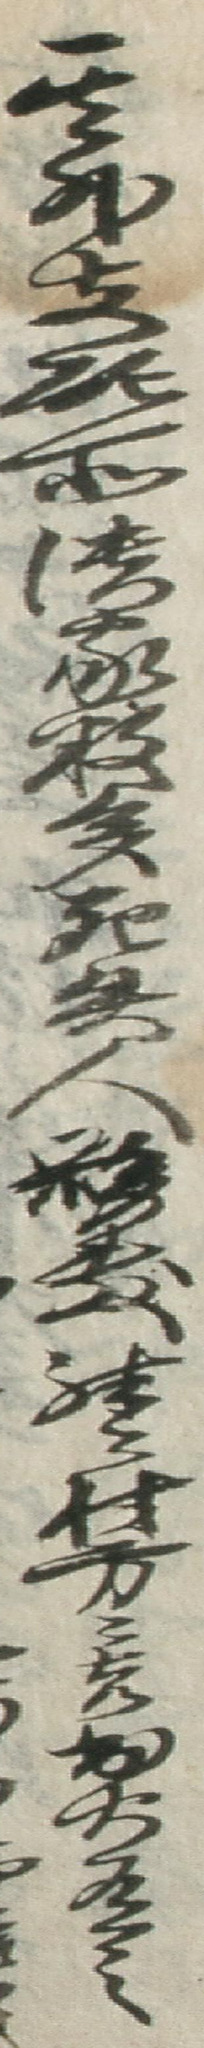其外支配所潰家数多死失夥敷殊二村方二は出火有之
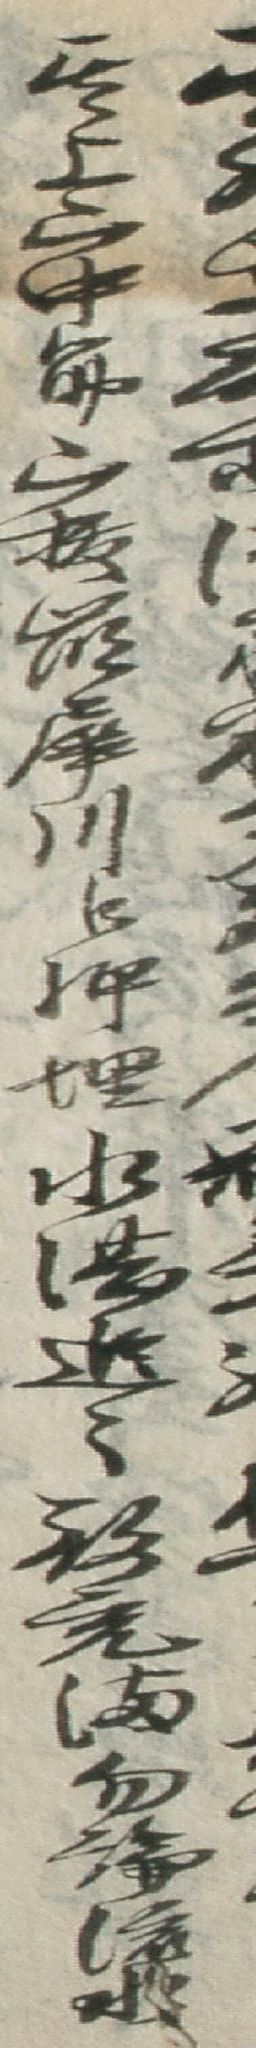其上山中筋山抜崩犀川江押埋水湛追々致充満勿論流水
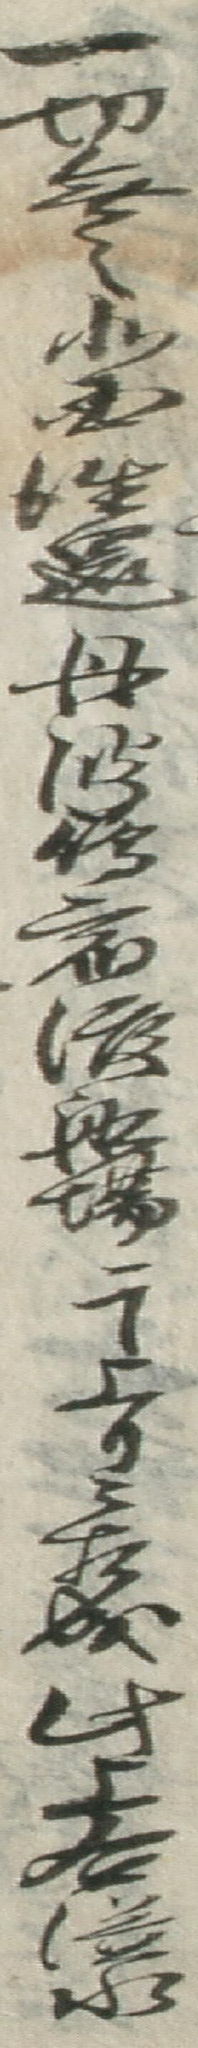一切無之北国往還丹波嶋宿渡船場干上り二相成此上右溢水
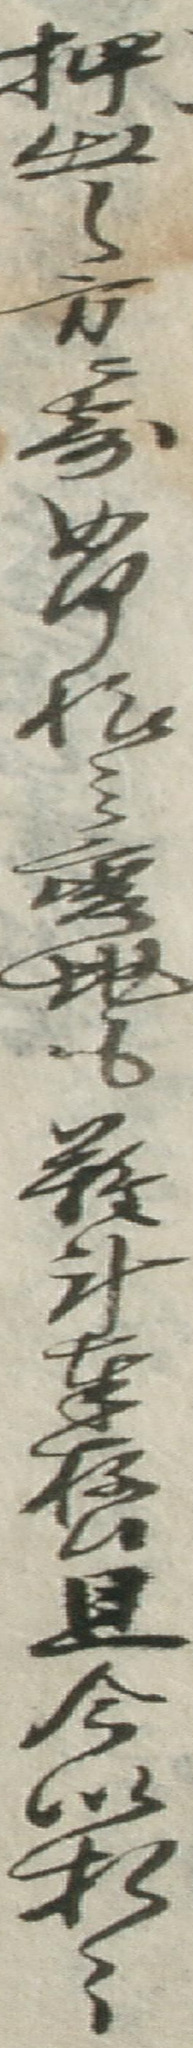押出し方二寄如何様之変地も難計奉存候且今以折々
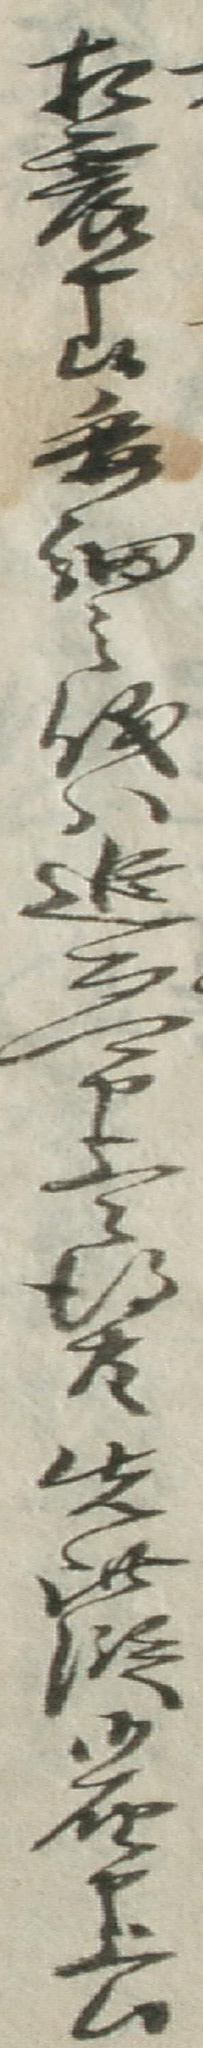相震申候委細之儀ハ追而可申上候得共先此段御届申上候
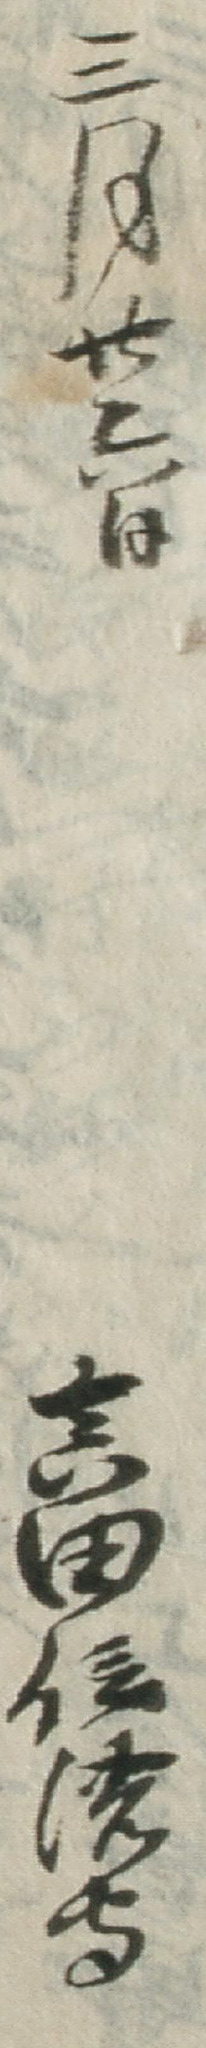三月廿六日真田信濃守
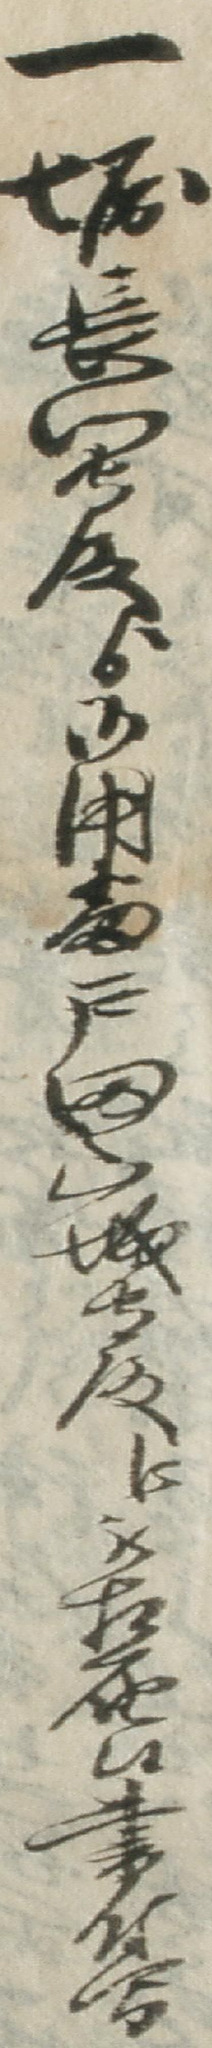一堀長門守殿ゟ御用番戸田山城守殿江被相届候書付写
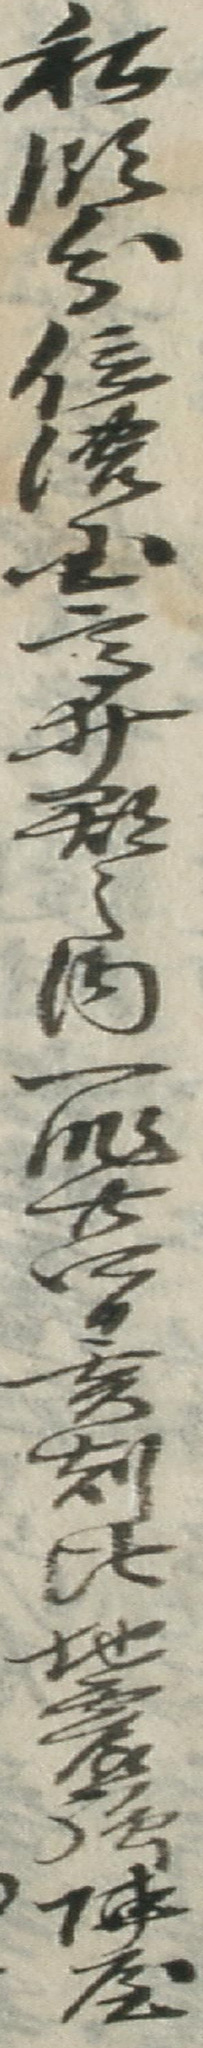私領分信濃国高井郡之内一昨廿四日亥刻比地震強陣屋
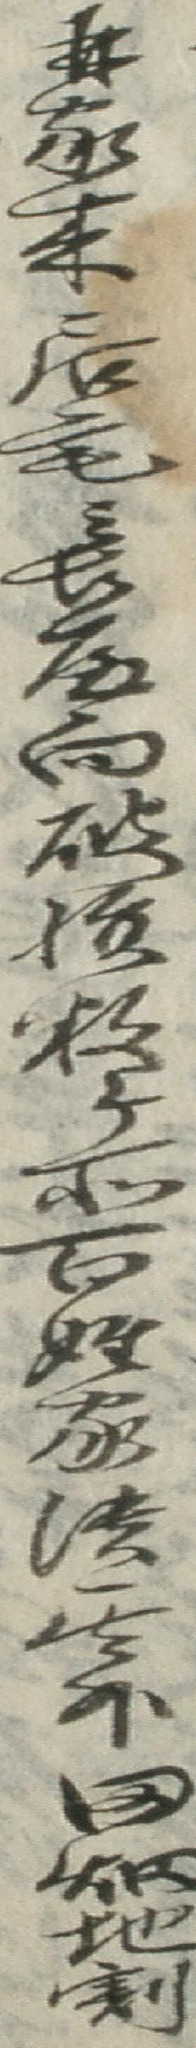并家来居宅之長屋向破損数ヶ所百姓家潰其外田畑地割
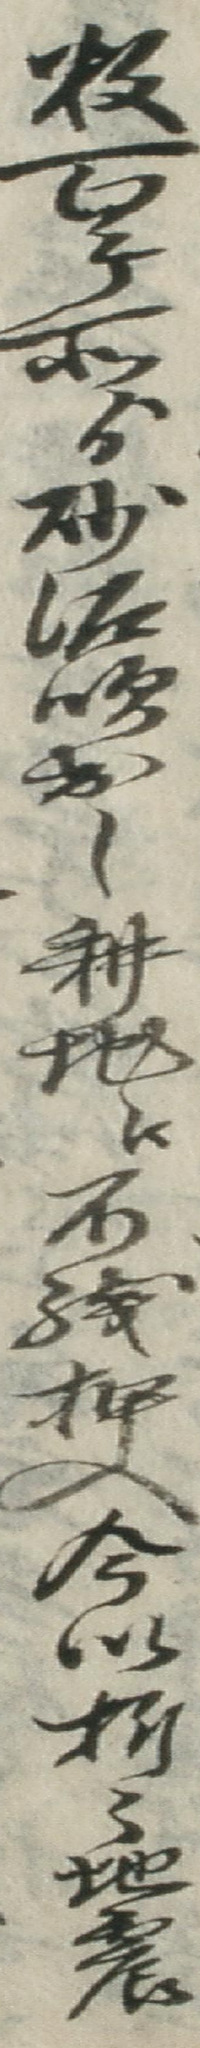数百ヶ所ゟ砂泥吹出し耕地江不残押入今以折々地震
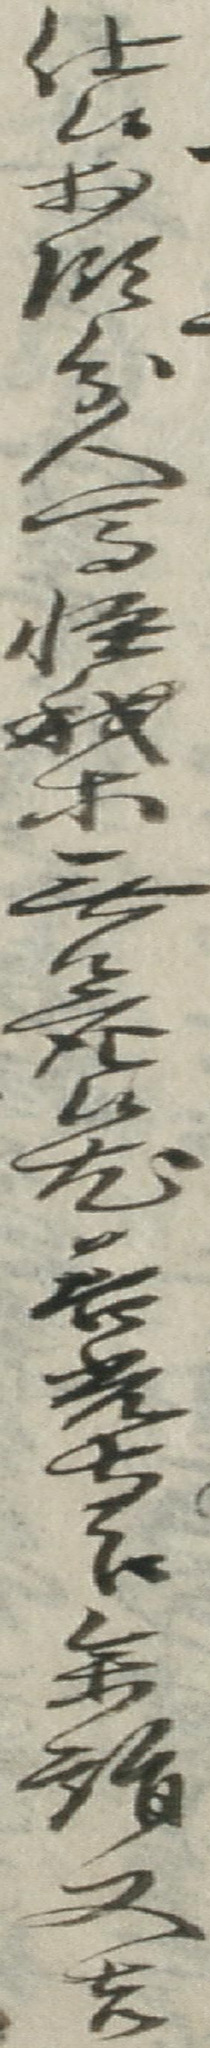仕候於領分人馬怪我等無御座候尤善光寺江参詣又は
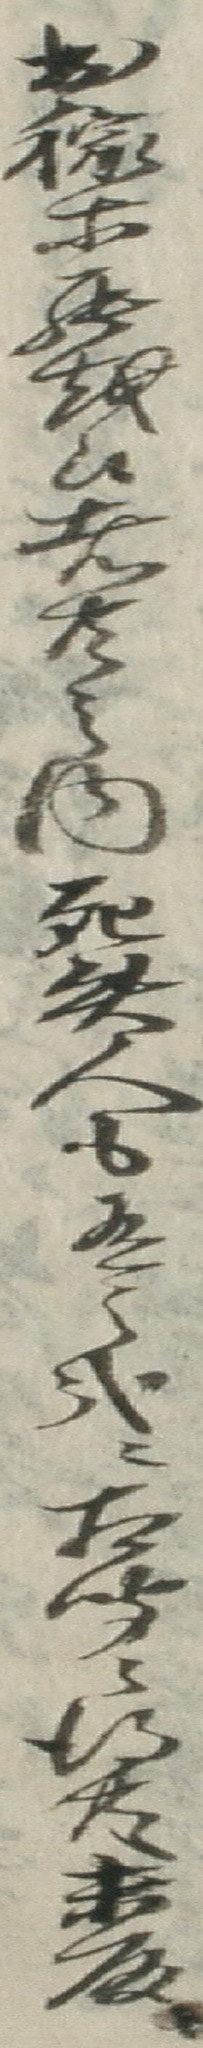出稼等罷越候者共之内死失人も有之哉二相聞候得共未取
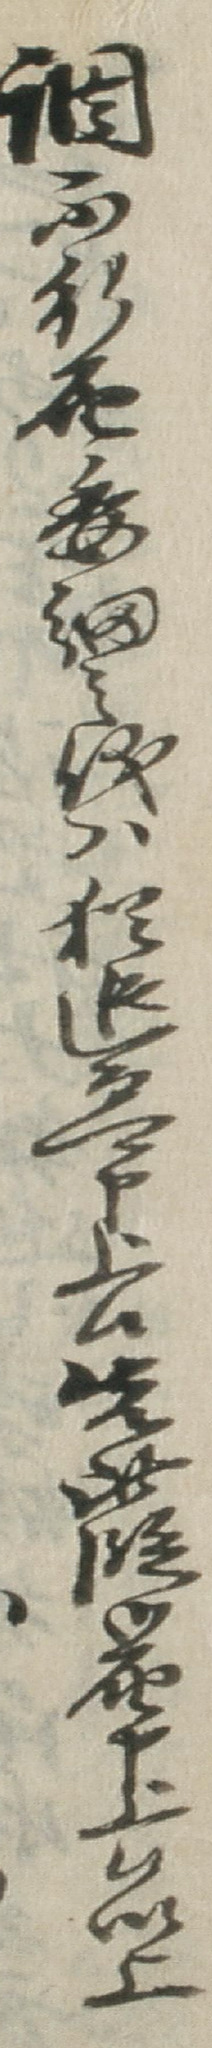調不行届委細之儀ハ猶追而可申上候先此段御届申上候以上
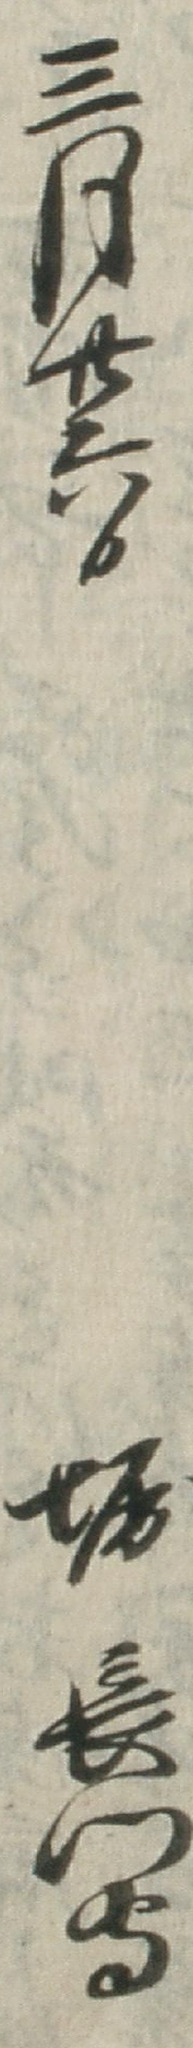三月廿六日堀長門守
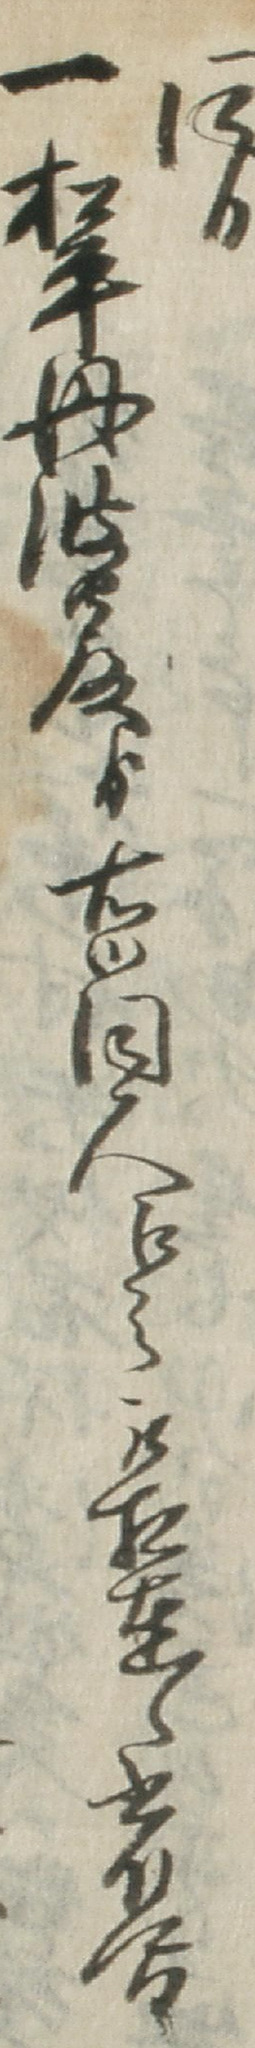一松平丹波守殿ゟ右御同人江之被相達候書付写
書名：信濃國地震實録記
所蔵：東京大学地震研究所図書室 Earthquake Research Institute Library, The University of Tokyo, JAPAN
